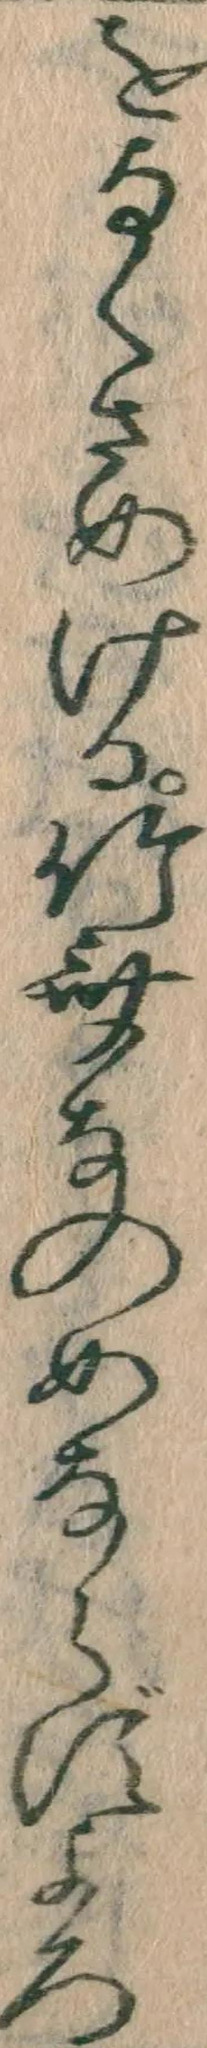をなくさめける。竹斎なのめならずよろ
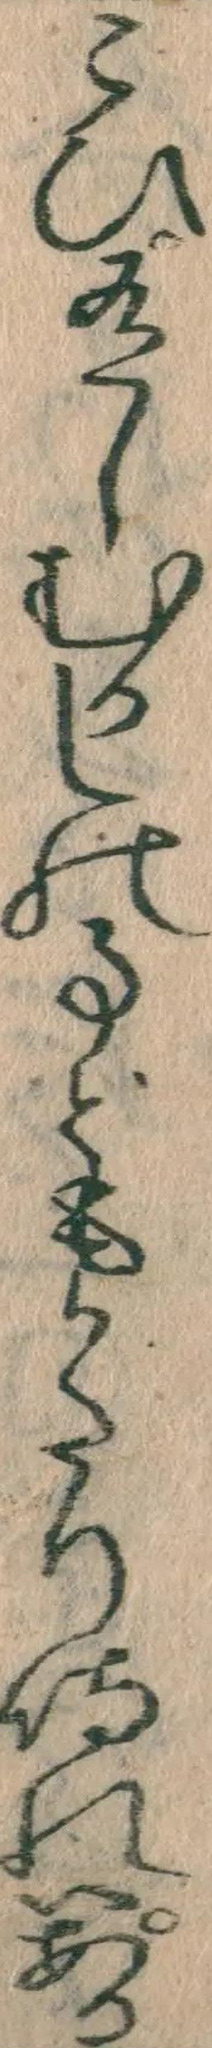こひ。有しむかしの事どもかたり侍れは。ある
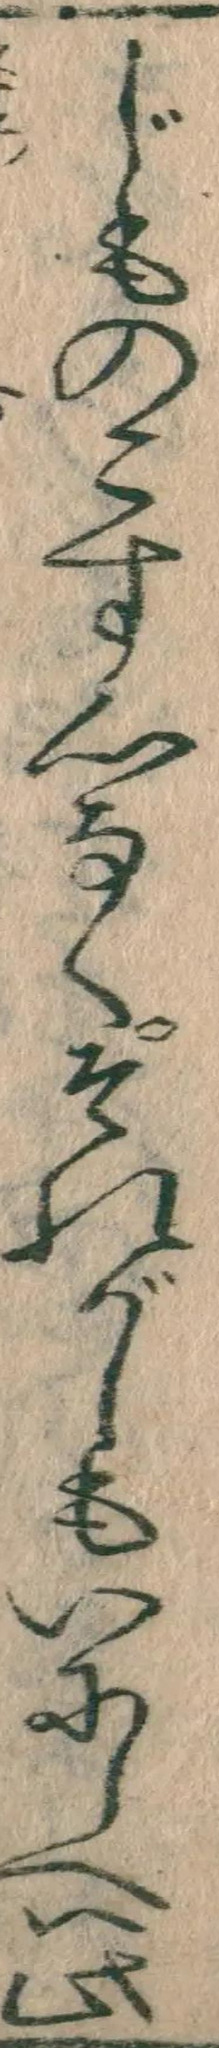じものこす心なく。それがしもいにしへは此
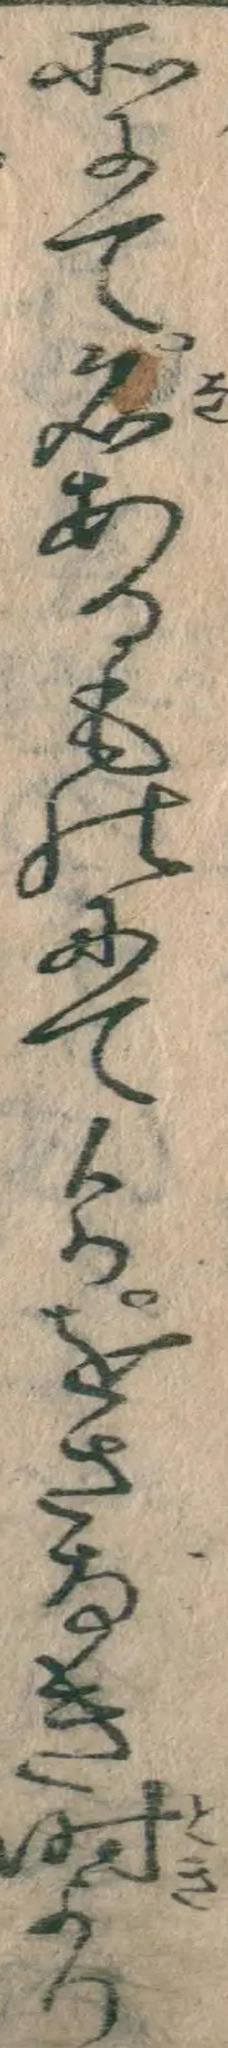所にて名あるものにて候か。をさなき時より
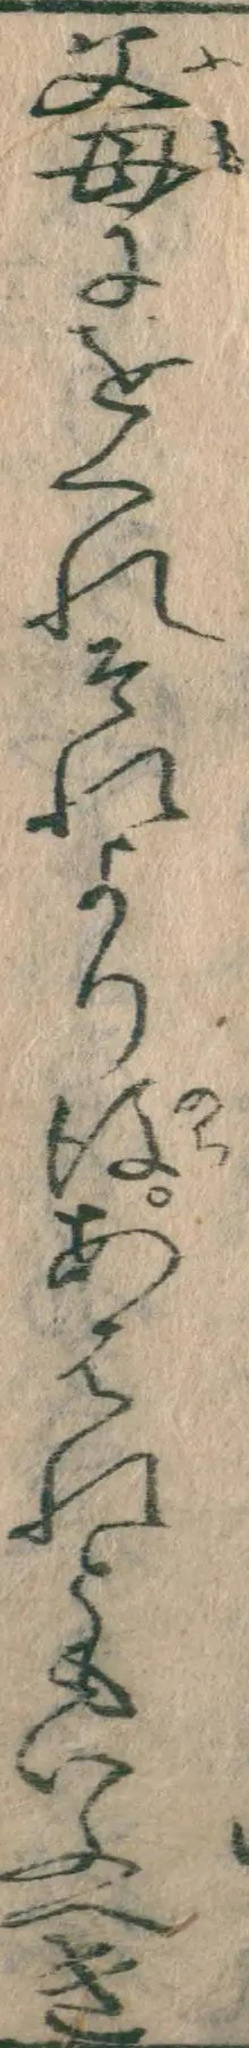父母にをくれそれより後。あはれともいふへき
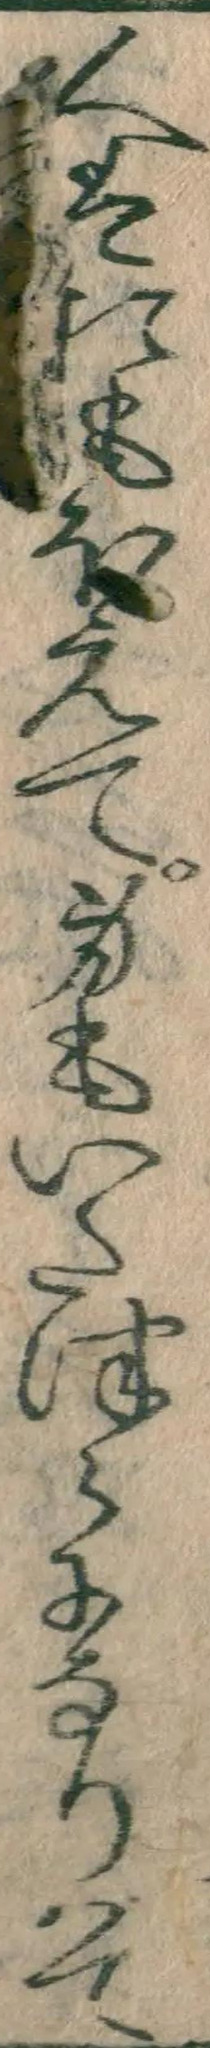人はおもほえて。身もいたつらになりはて
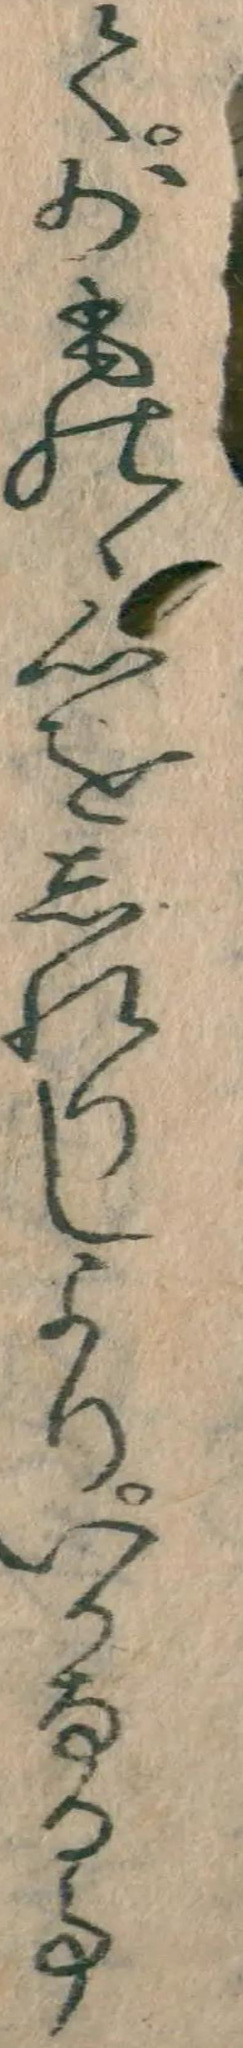て。少ものゝ心をしれりしより。いかなる事

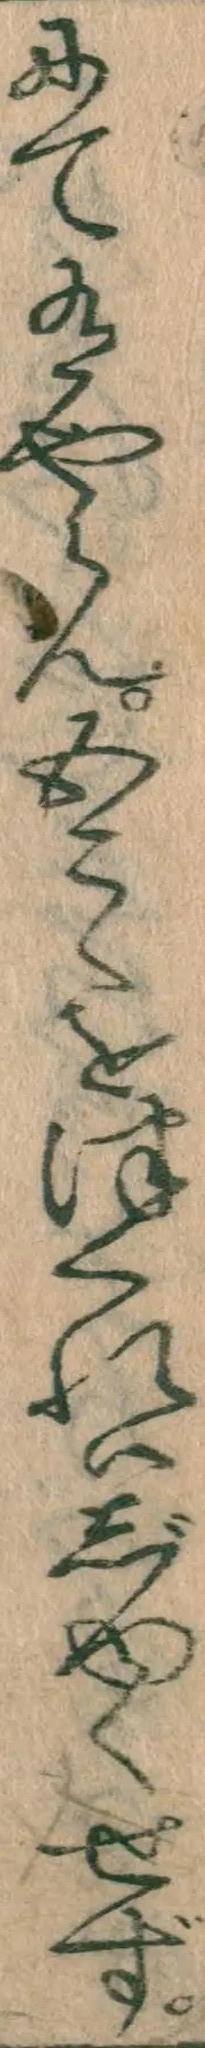にて有やらん。五こくをつくれはじゆくせず。
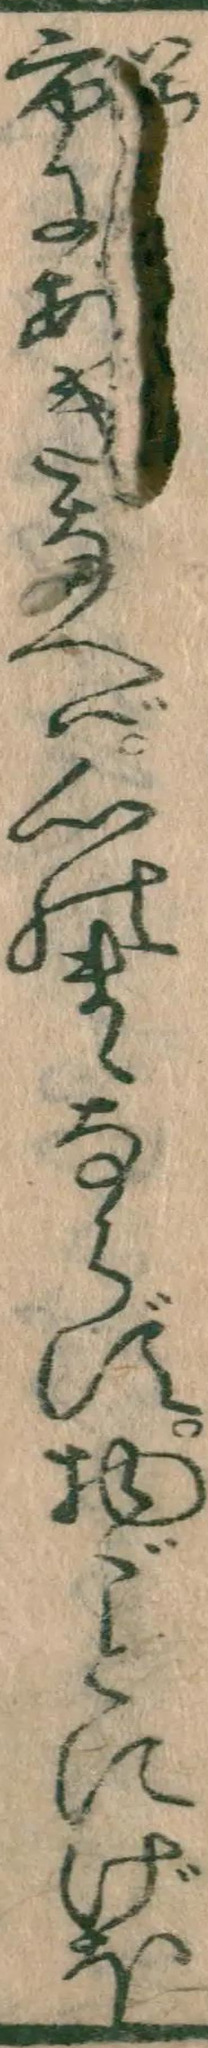市にあきなへば。心のまゝならず。物ごとにげほ
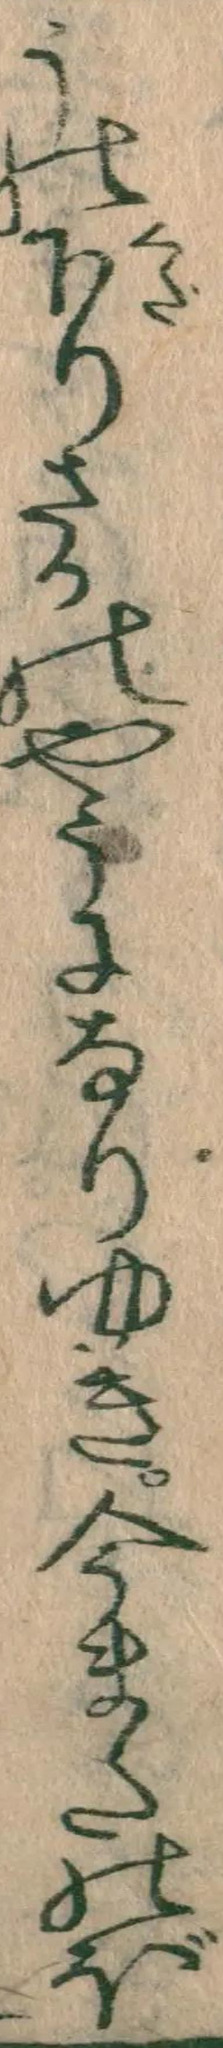うの下りさかのやうになりゆき。今またのぼ
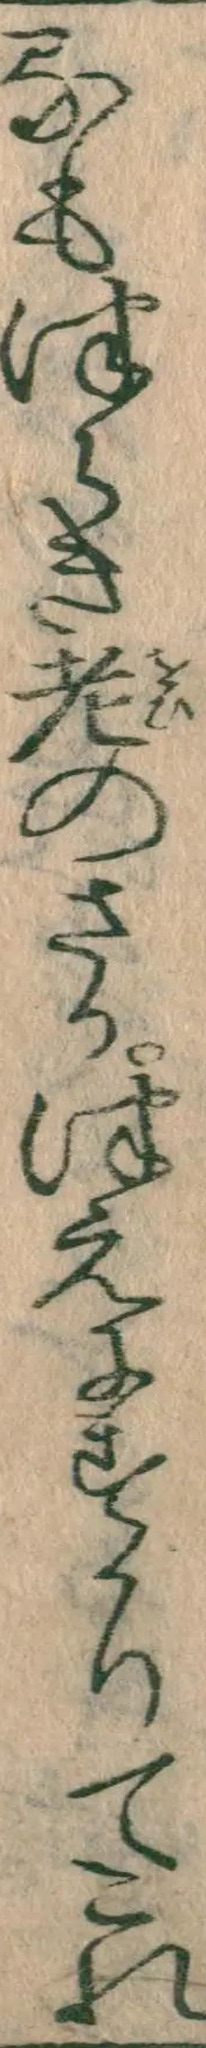るもつらき老のさか。つえにすかりてこれ
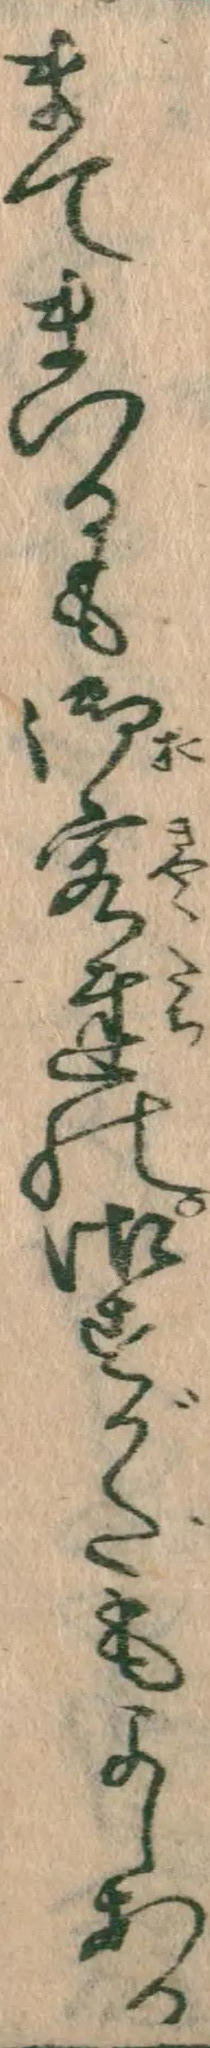まてまいるも御客達の。御すがたもよしある
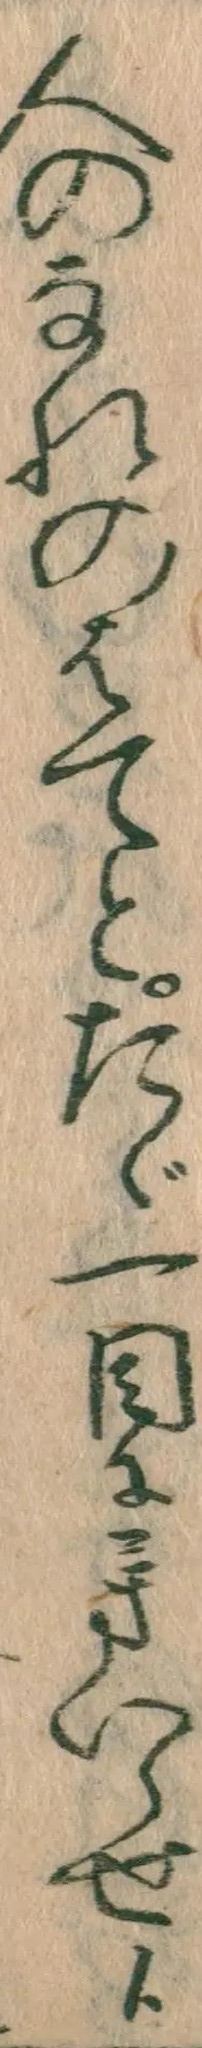人のなれのはてと。たゞ一目にみまいらせ候
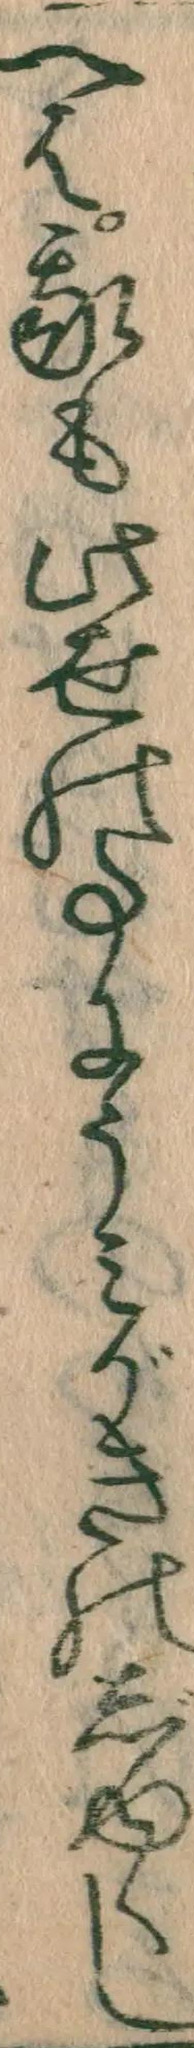へは。我も此世の事にうみがきのじゆくし
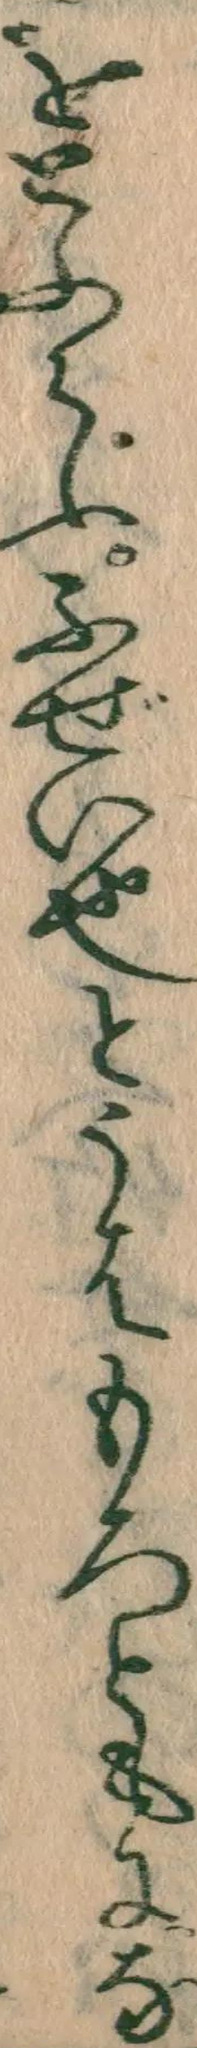をとふらふ。ふぜい也とうはもろともにな
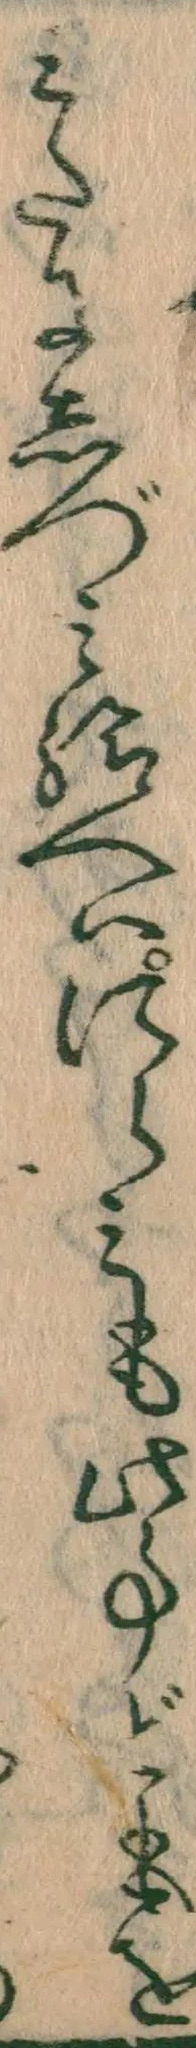みたにしづみ給へは。にらみも此事どもを
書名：竹斎狂歌物語 3巻
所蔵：国立国会図書館 National Diet Library, JAPAN
